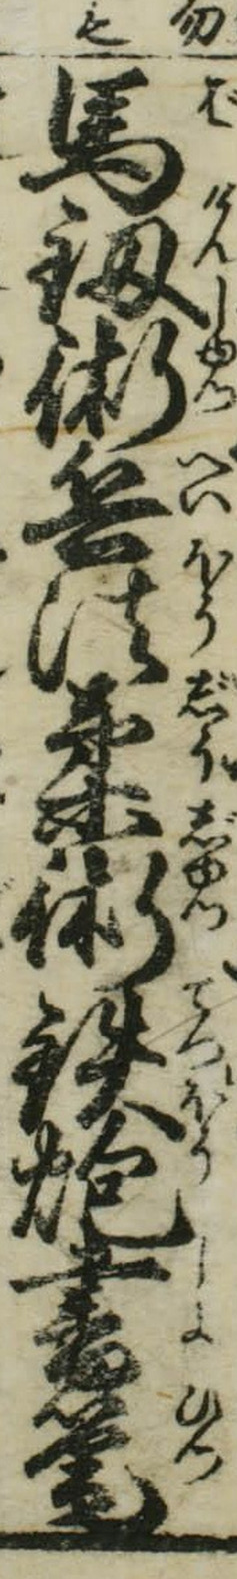馬剣術兵法柔術鉄砲書筆
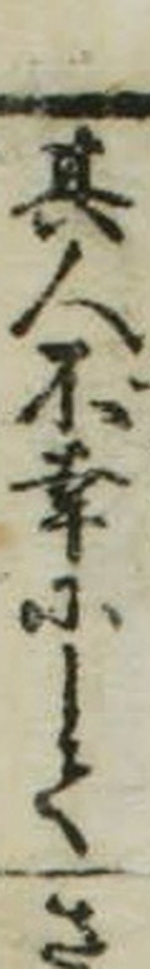其人不幸にして
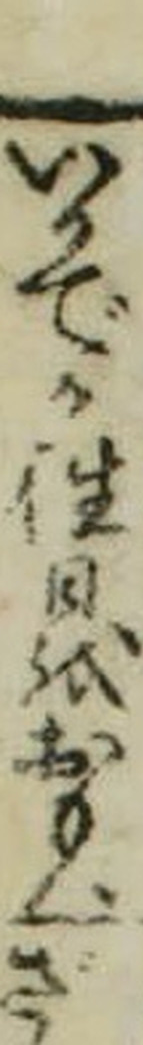いかでか往日をおもは
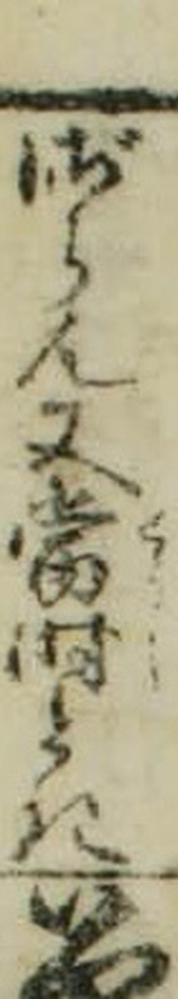づらん又当時とき
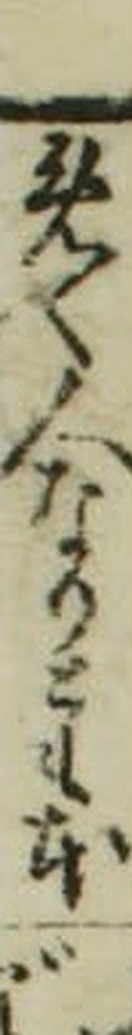めく人なりとも本
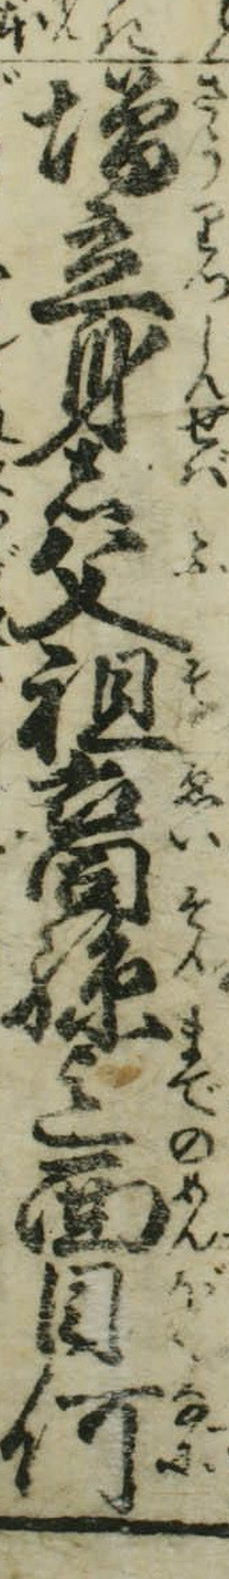増立身は父祖裔孫迄之面目何
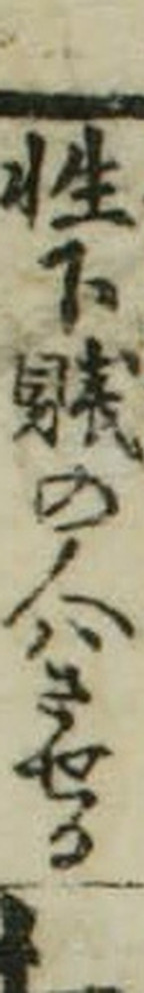性下賤の人はさせる
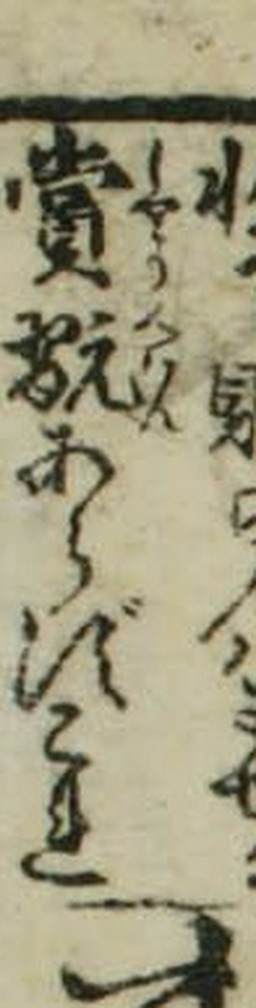賞翫あらずこれ
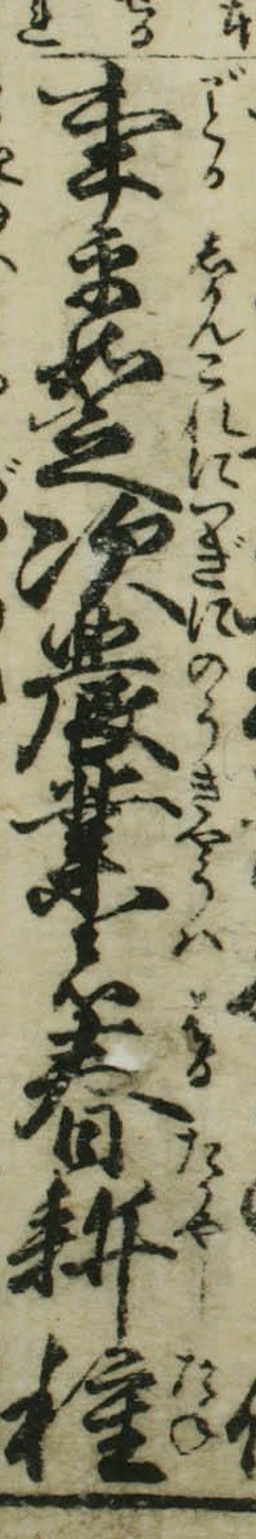事乎如之次農業は春耕種
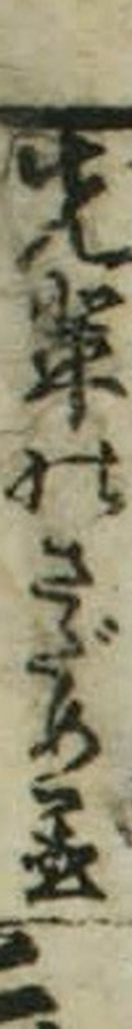先輩のさだめ置
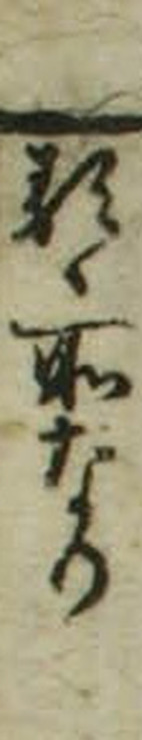るゝ所なり
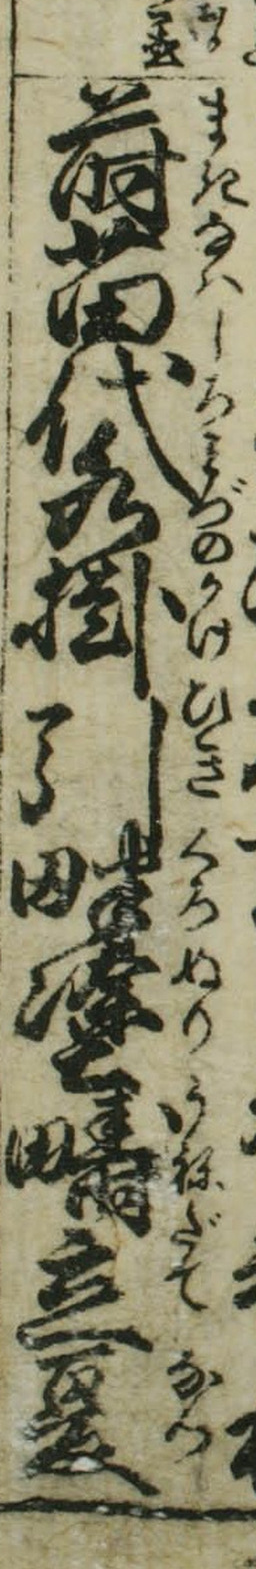蒔苗代水掛引畔塗畦立夏
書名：増補職人往来
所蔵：東京学芸大学教育コンテンツアーカイブ
